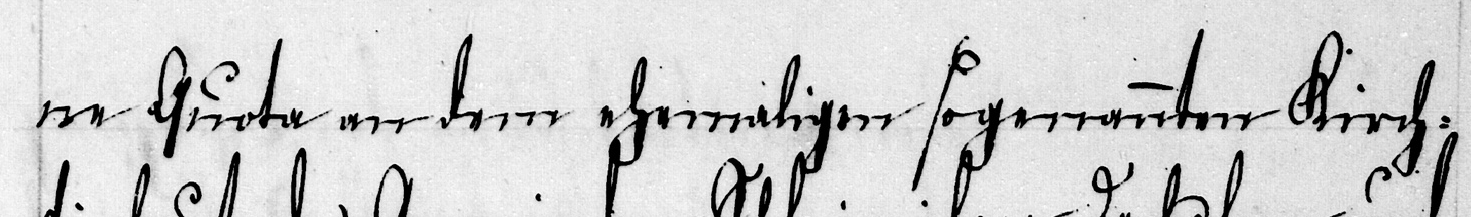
ne Quota an dem ehemaligen sogenannten Kirch¬
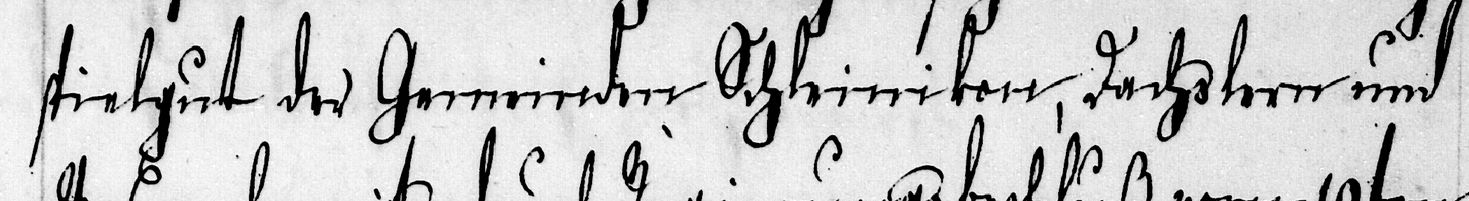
spielgut der Gemeinden Schleinikon, Dachslern und
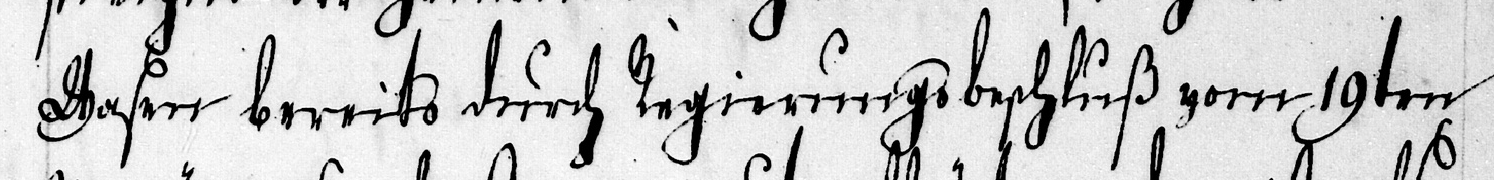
Wasen bereits durch Regierungsbeschluß vom 19ten
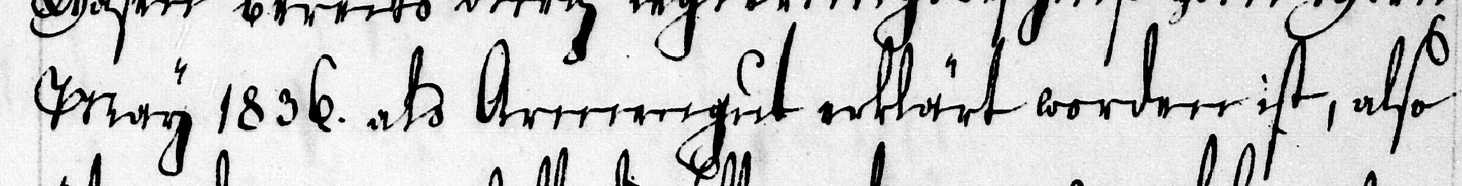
May 1836. als Armengut erklärt worden ist, also
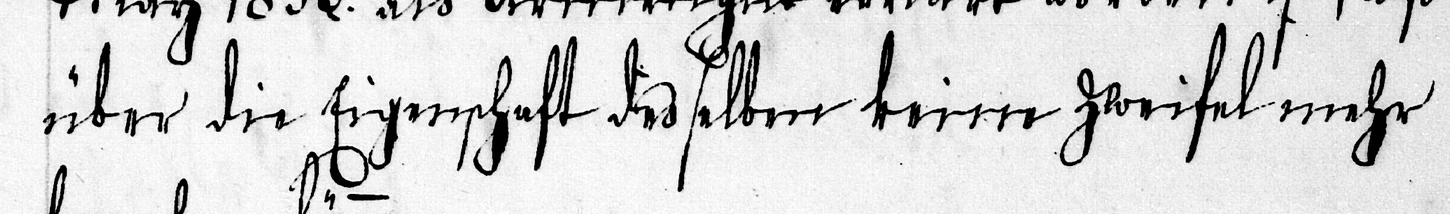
über die Eigenschaft desselben keine Zweifel mehr
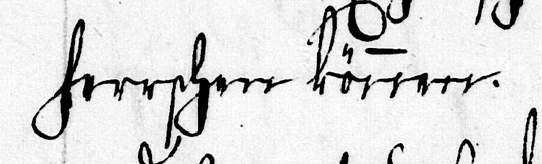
herrschen können.
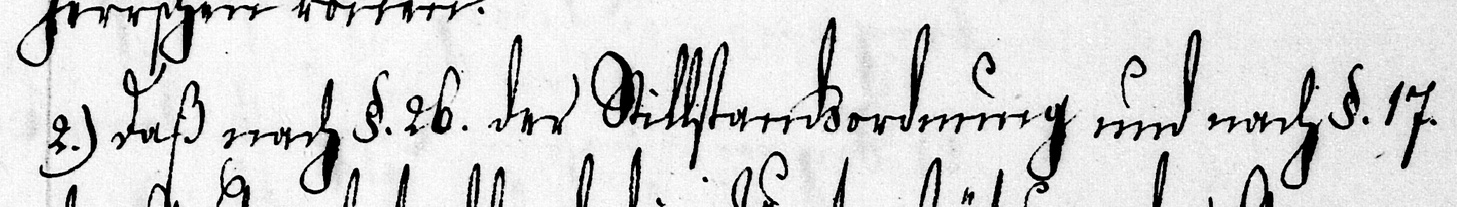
2.) Daß nach §. 26. der Stillstandsordnung und nach §. 17.
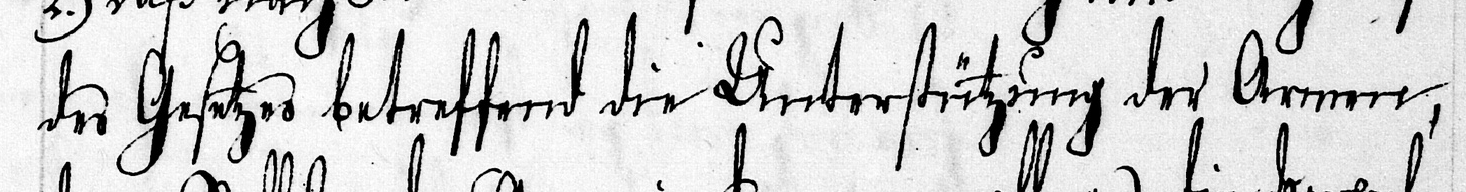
des Gesetzes betreffend die Unterstützung der Armen,
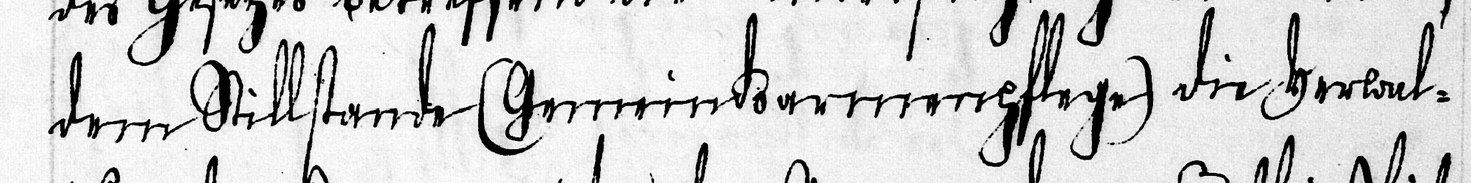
dem Stillstande (Gemeindsarmenpflege) die Verwal¬
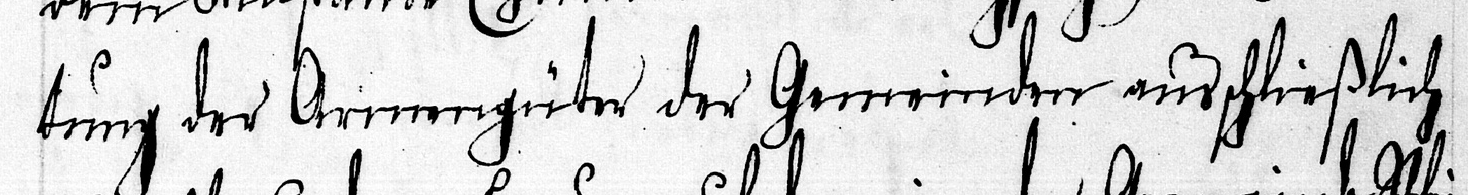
tung der Armengüter der Gemeinden ausschließlich
